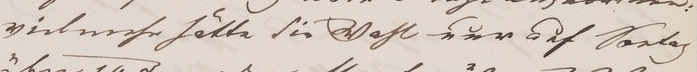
vielmehr hätte die Wahl nur auf Sontag
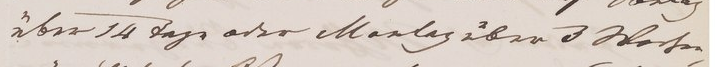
über 14 Tage oder Montag über 3 Wochen,
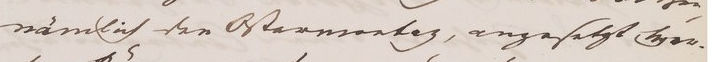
nämlich den Ostermontag, angesetzt wer-
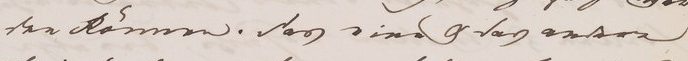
den können. Das eine & das andere
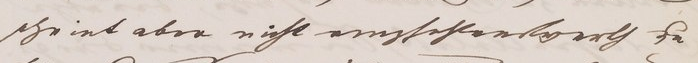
scheint aber nicht empfehlenswerth zu
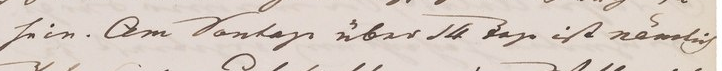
sein. Am Sontage über 14 Tage ist nämlich
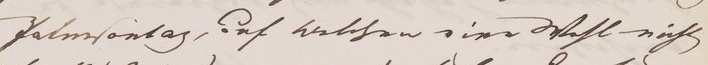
Palmsontag, auf welchen eine Wahl nicht
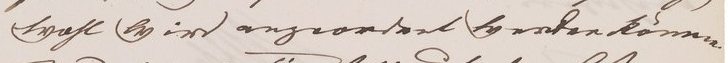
wohl wird angeordnet werden können.
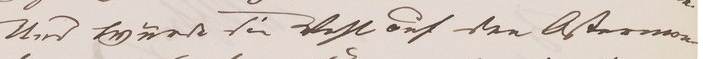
Und würde die Wahl auf den Ostermon-
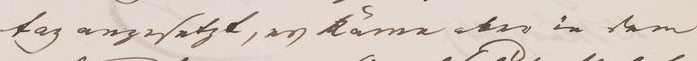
tag angesetzt, es käme aber in dem
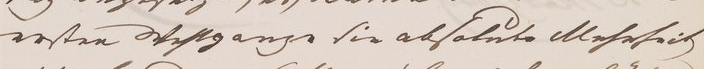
ersten Wahlgange die absolute Mehrheit
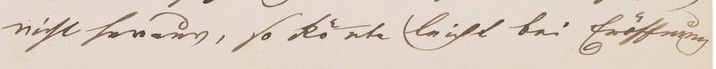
nicht heraus, so könnte leicht bei Eröffnung
